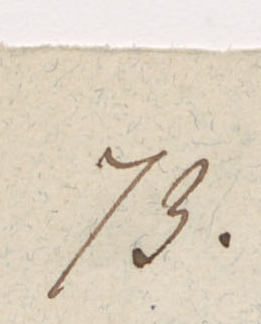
73.
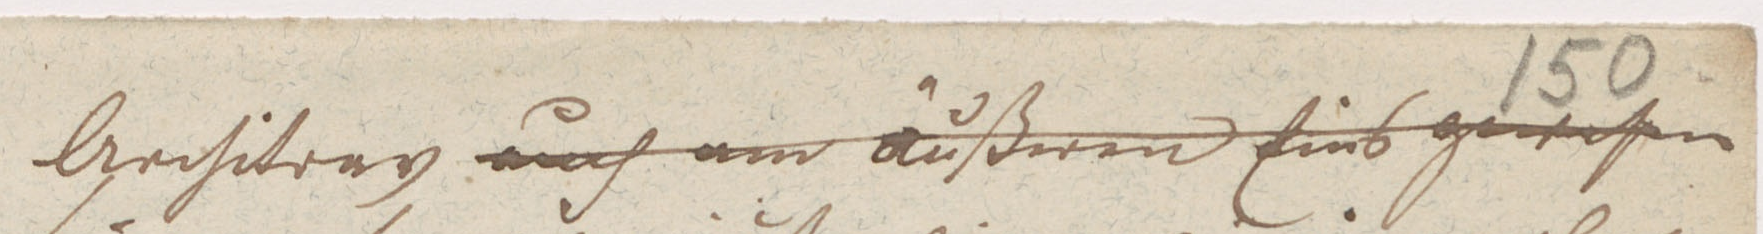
Architrav auch am äusseren Eins gewesen
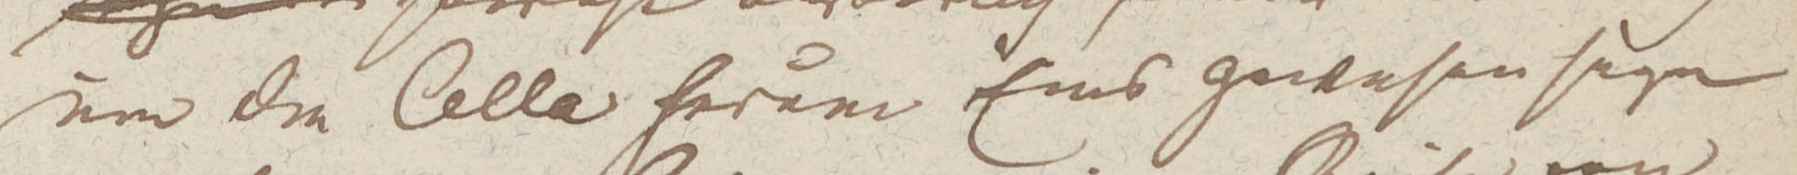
um die Cella herum Eins gewesen seyn
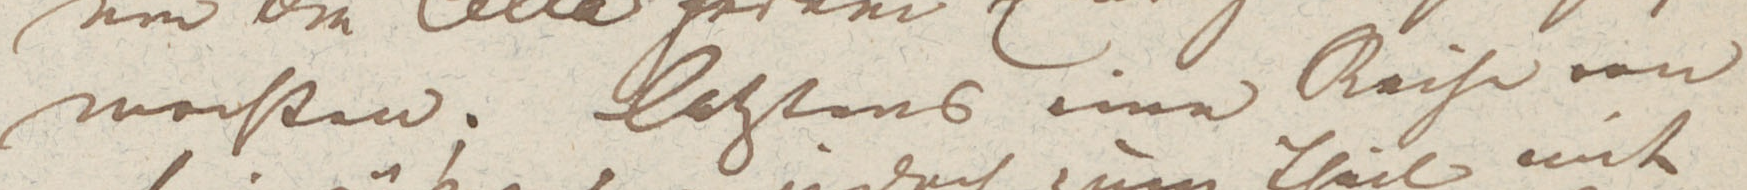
mochten; letztens eine Reihe von
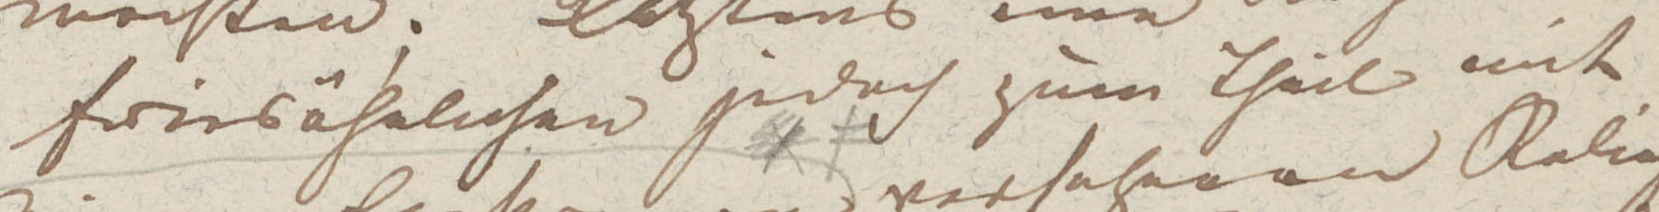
friesähnlichen jedoch zum Theil mit
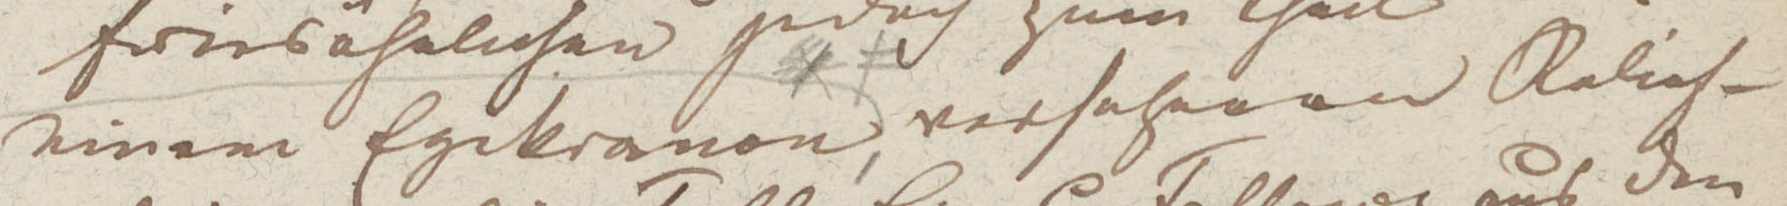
einem Epikranon, % % versehenen Relief-
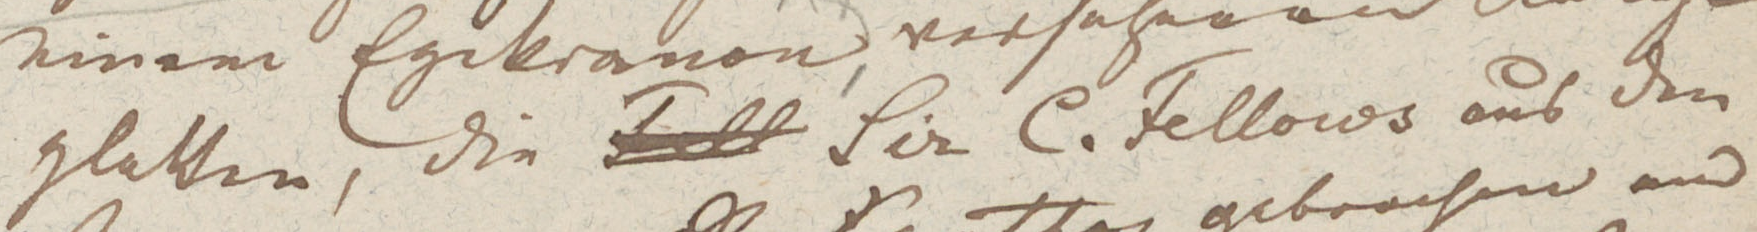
platten, die Fell Sir C. Fellows aus den
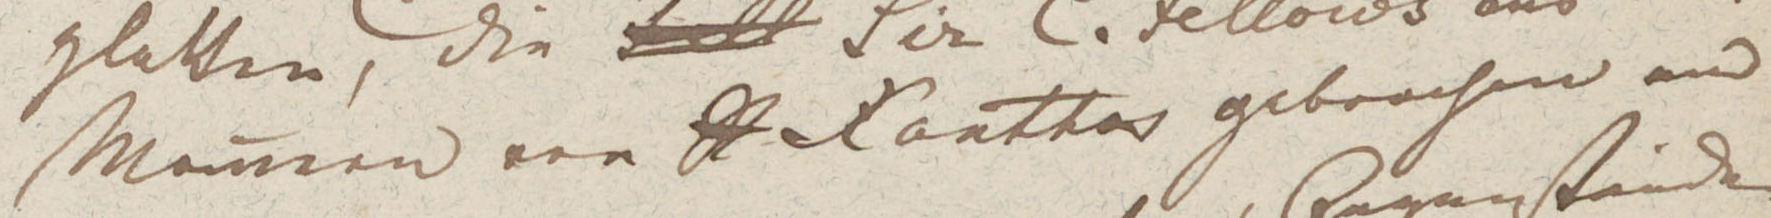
Mauern von St Canthos gebrochen und
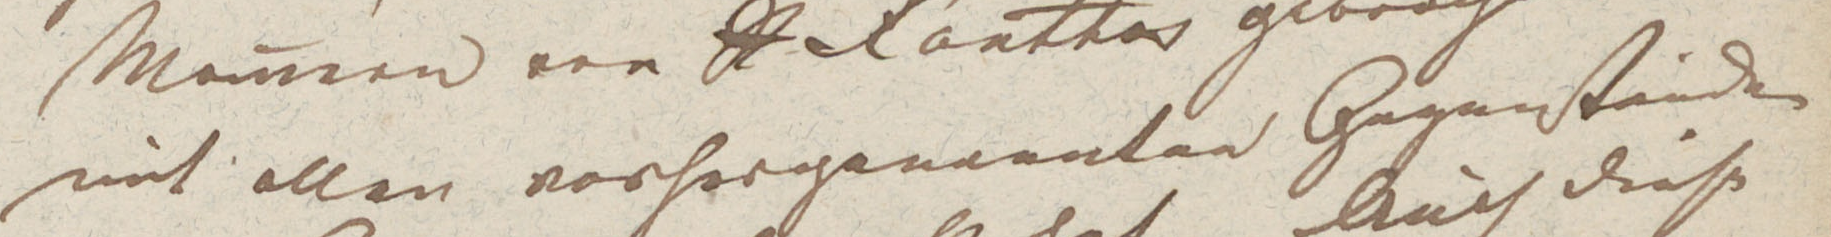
mit allen vorhergennanten Gegenständen
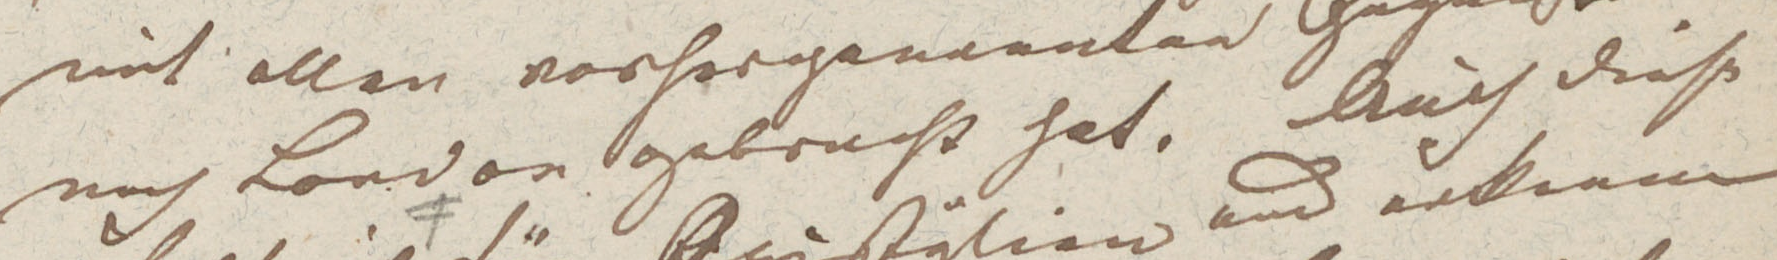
nach London gebracht hat. Auch diese
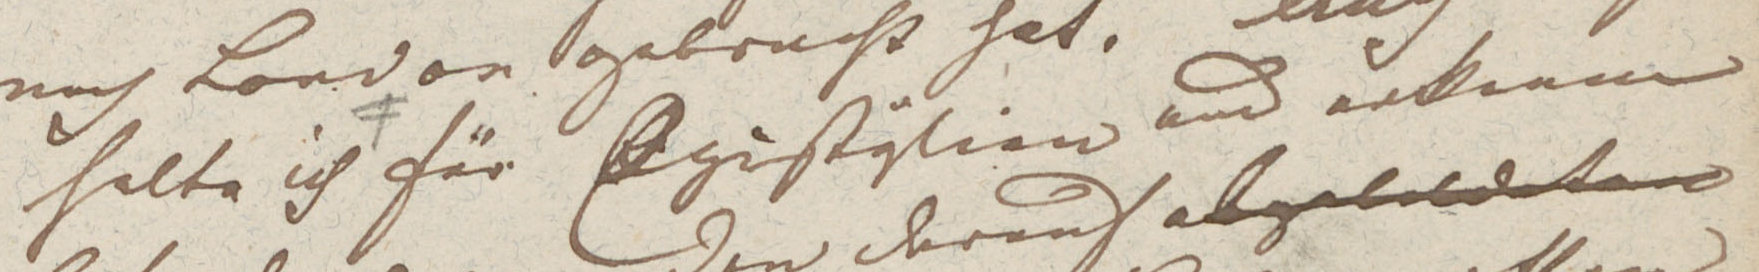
halte ich % für Epistylien und erkenne
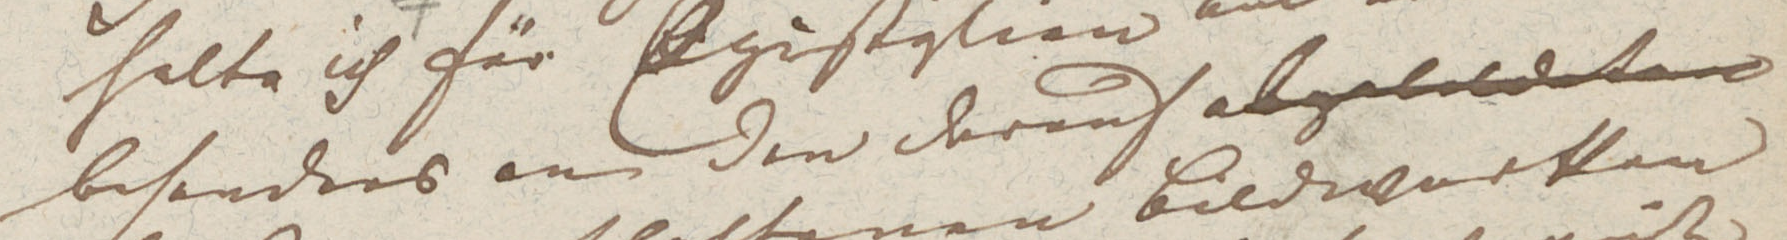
besonders an den darauf abgebildeten
